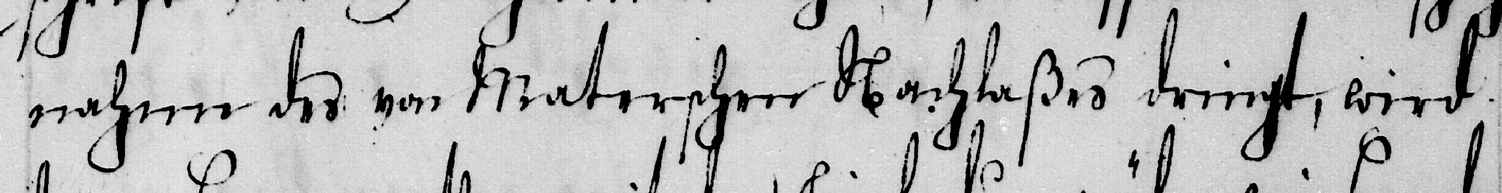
nahme des von Materschen Nachlaßes dringt, wird
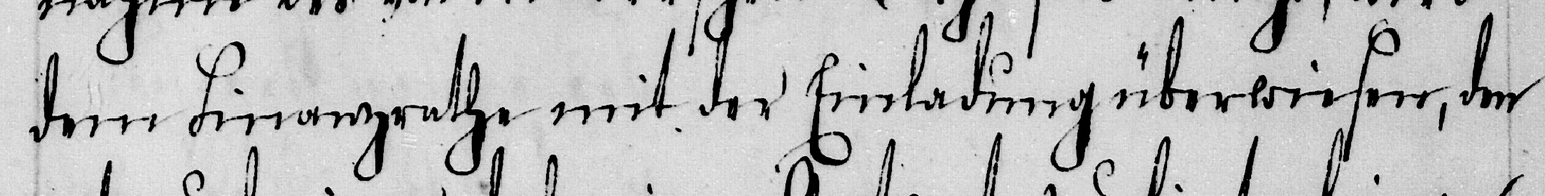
dem Finanzrathe mit der Einladung überwiesen, den
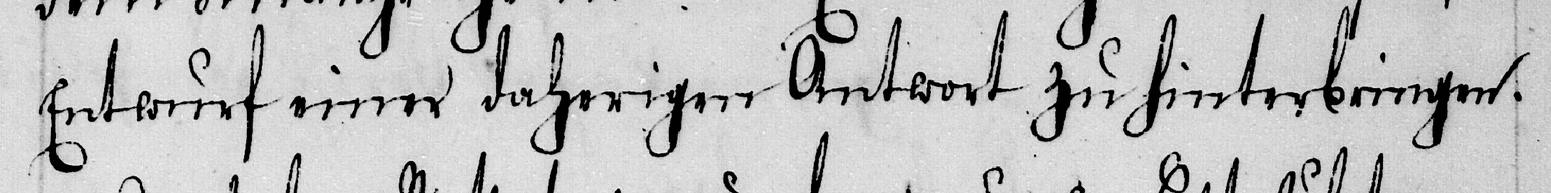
Entwurf einer daherigen Antwort zu hinterbringen.
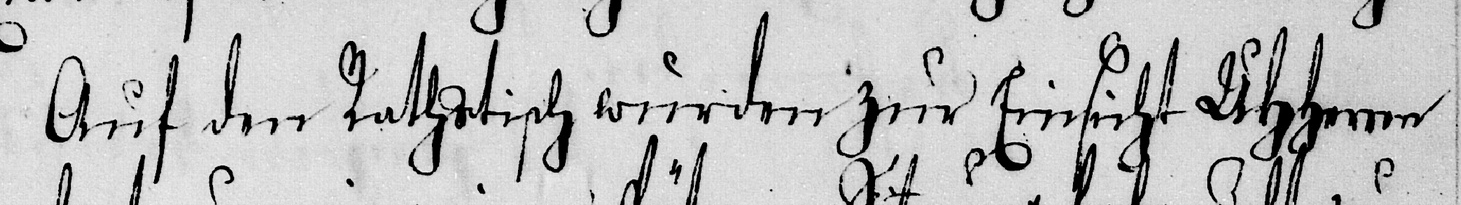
Auf den Rathstisch wurden zur Einsicht UHHerren
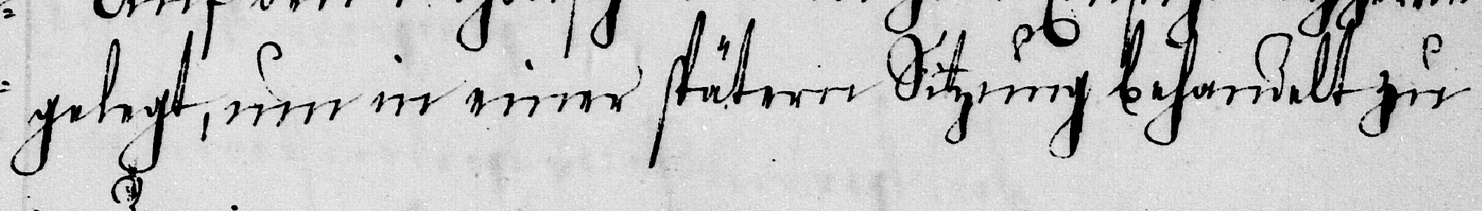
gelegt, um in einer spätern Sitzung behandelt zu
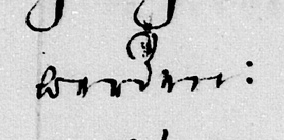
werden:
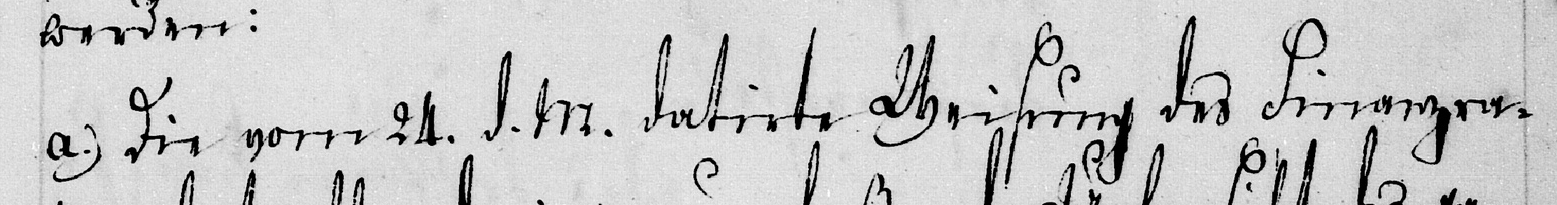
a.) Die vom 24. d. M. datirte Weisung des Finanzra¬
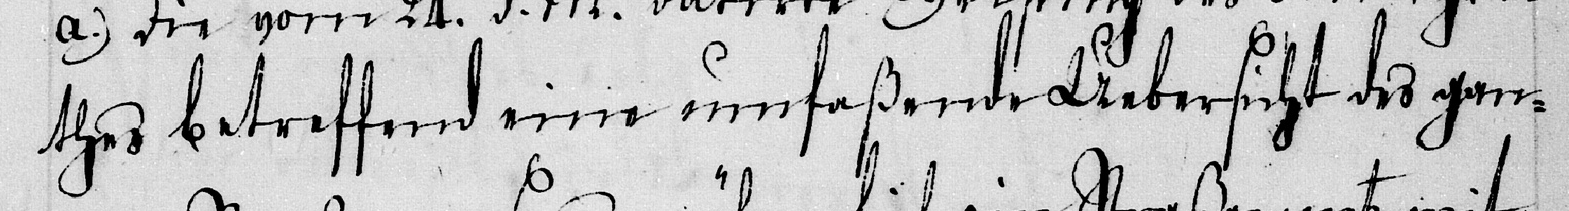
thes betreffend eine umfaßende Uebersicht des gan¬
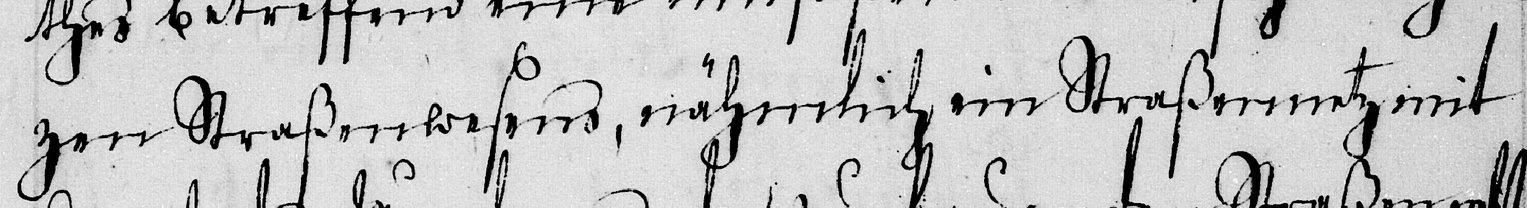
zen Straßenwesens, nähmlich ein Straßennetz mit
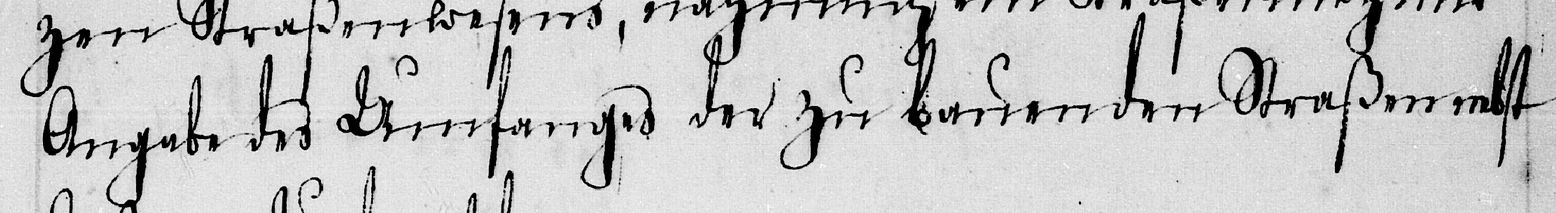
Angabe des Umfangs der zu bauenden Straßen nebst
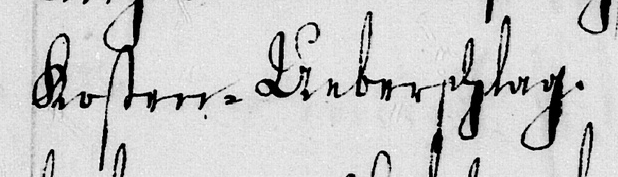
Kosten-Ueberschlag.
